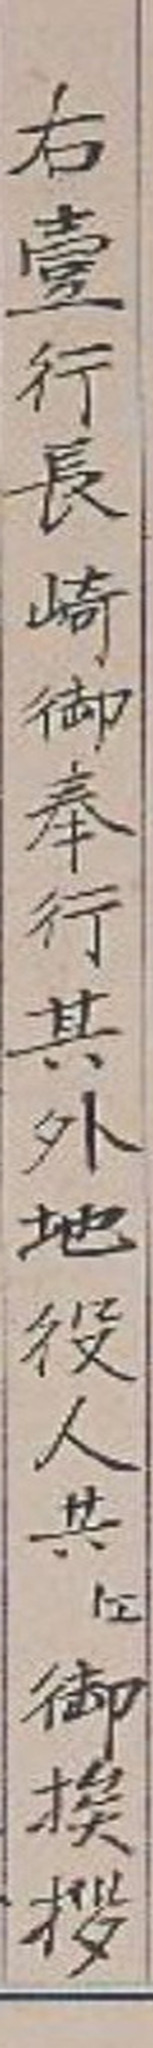右壹行長崎御奉行其外地役人江共御挨拶
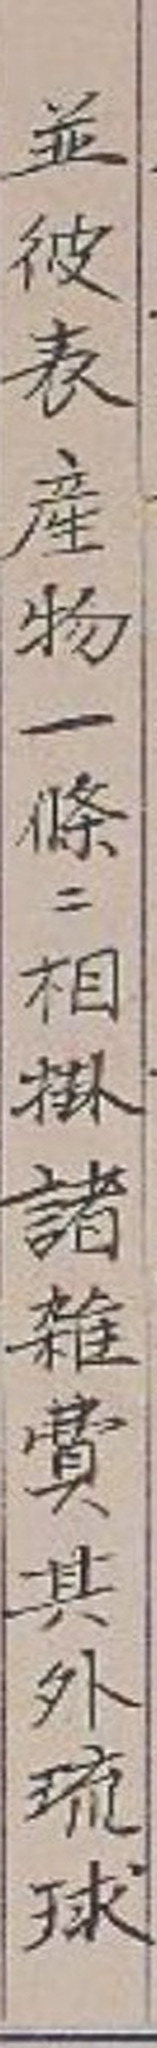並彼表産物一條ニ相掛諸雑費其他琉球
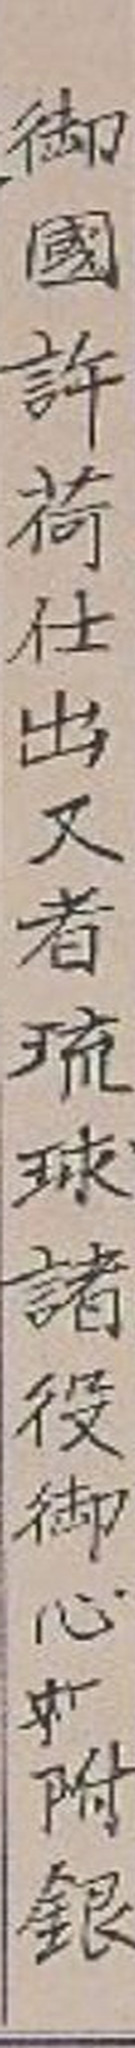御國許荷仕出又者琉球諸役心附銀
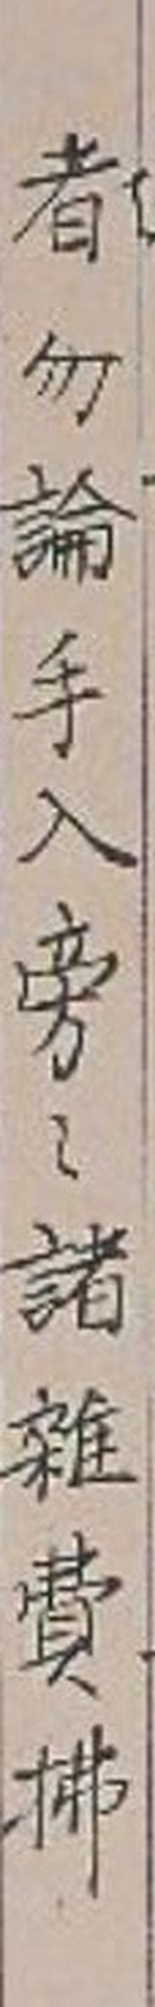者勿論手入旁〻諸雜費拂
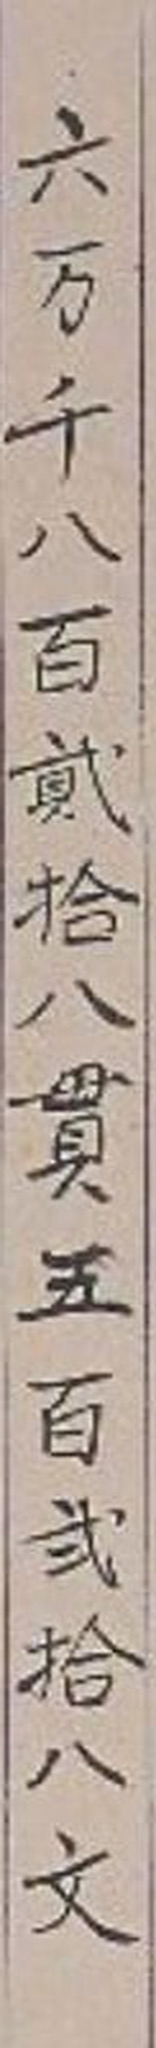六万千八百貮拾八貫五百弐拾八文
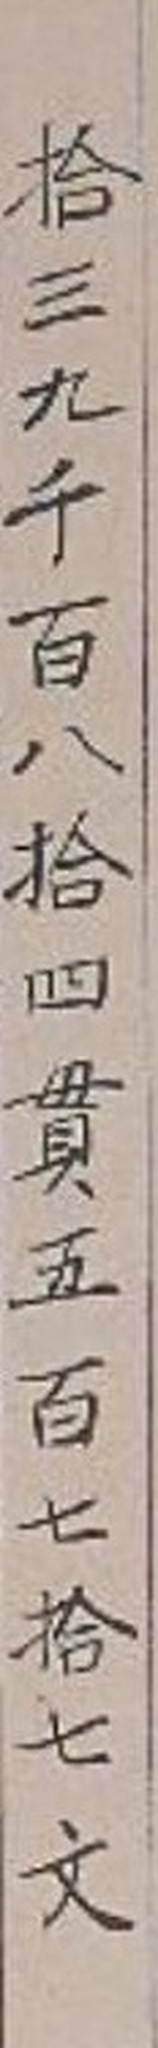拾三九千百八拾四貫五百七拾七文
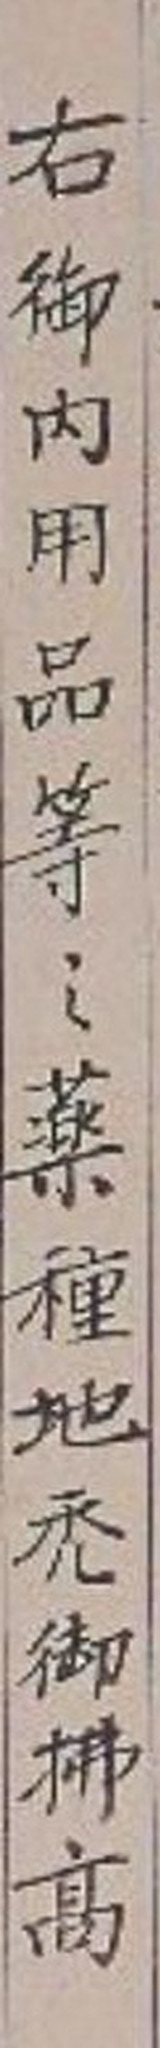右御内用品等〻薬種地禿御拂髙

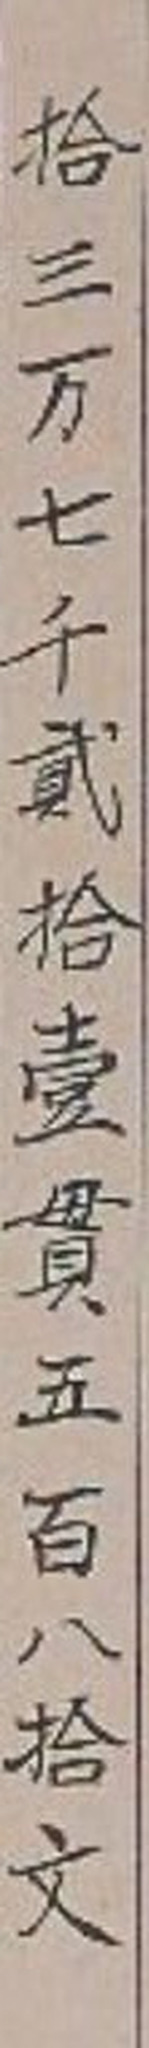拾三万七千貳拾壹貫五百八拾文
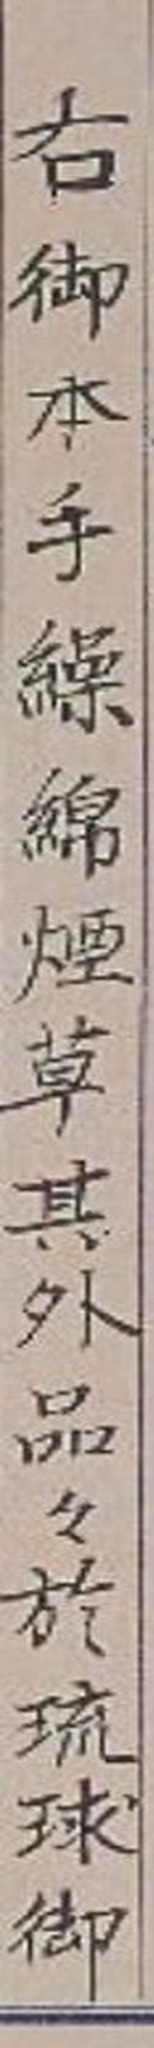右御本手繰綿煙草其外品々於琉球御
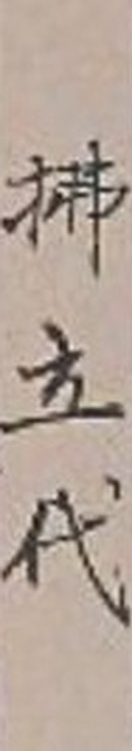拂立代
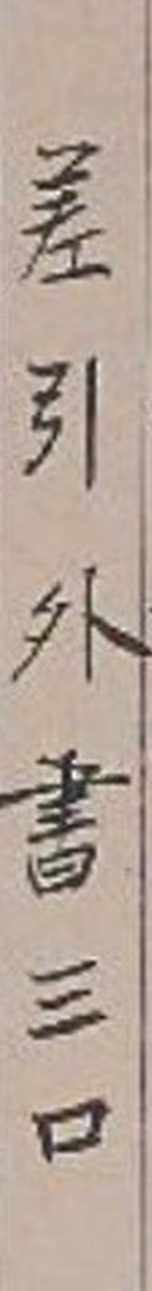差引外書三口
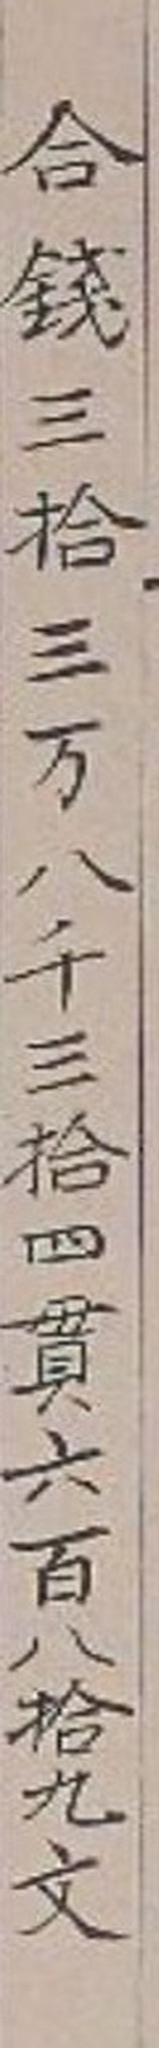合錢三拾三万八千三拾四貫六百八拾九文
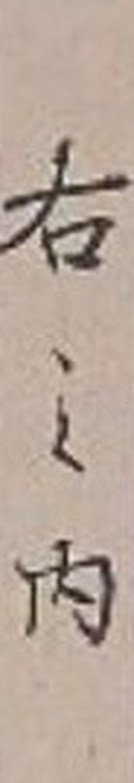右之内
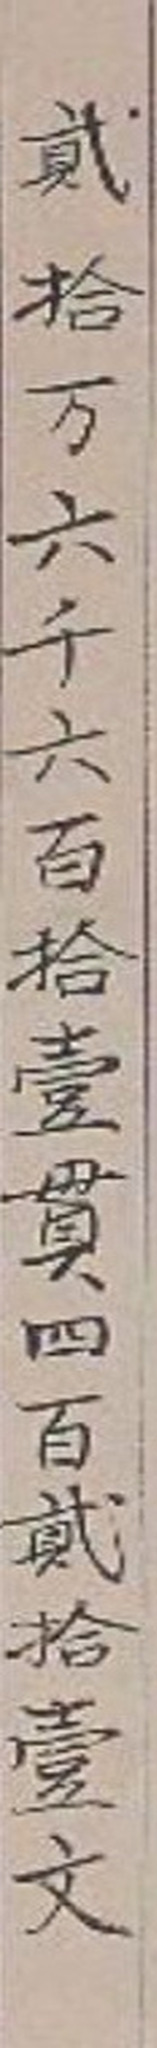貳拾万六千六百拾壹貫四百貳拾壹文
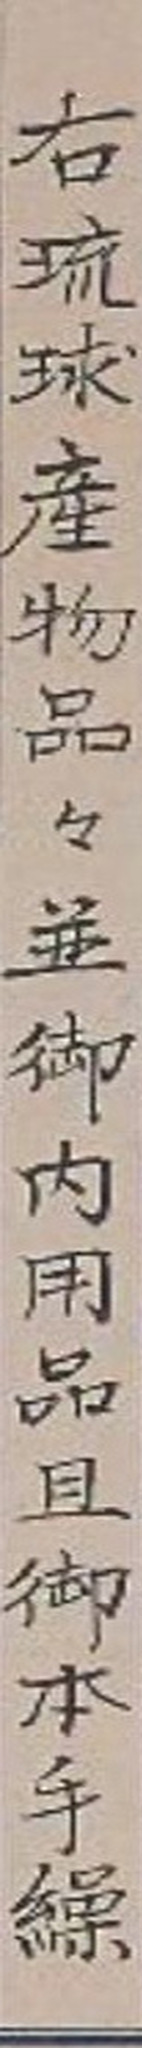右琉球産物品々並御内用品且御本手繰
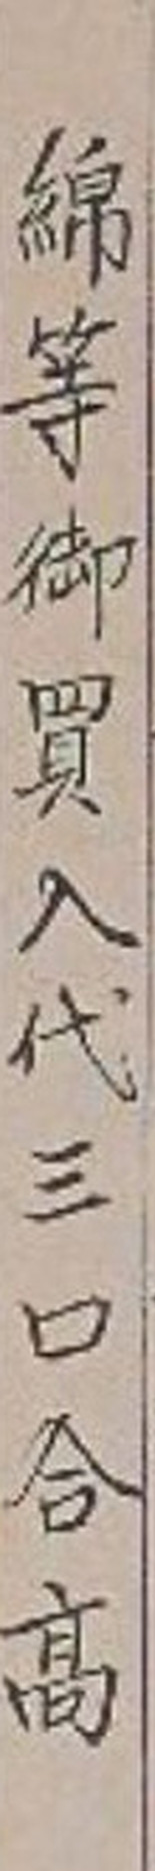綿等御買入代三口合髙
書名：琉球産物於長崎拂立並本手品利潤総帖 弘化四年より酉年迄
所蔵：University of the Ryukyus Library
